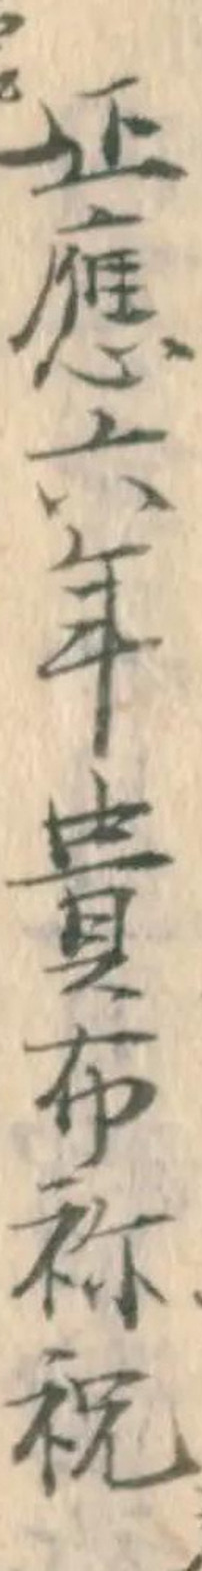正応六年貴布祢祝
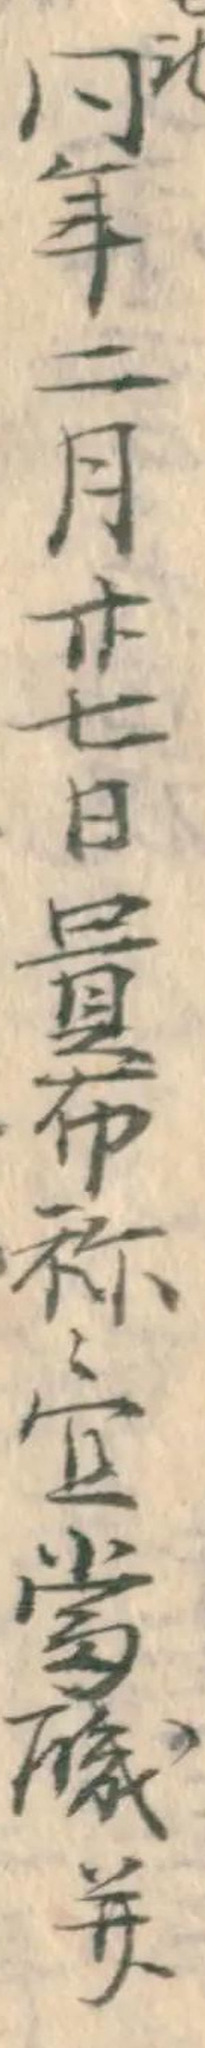同年二月廿七日貴布祢々宜当職并
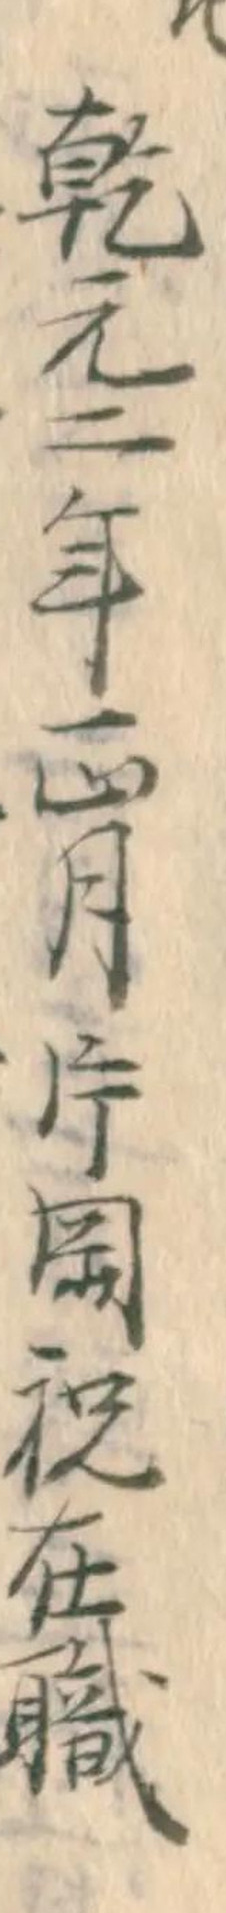乾元二年正月片岡祝在職
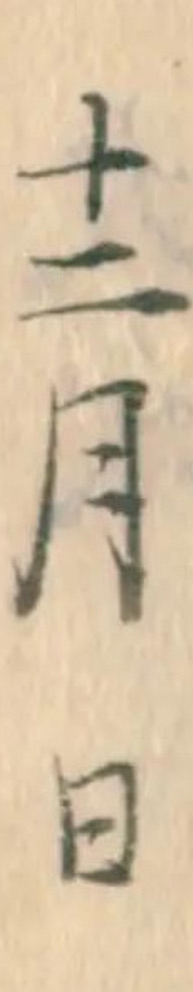十二月日
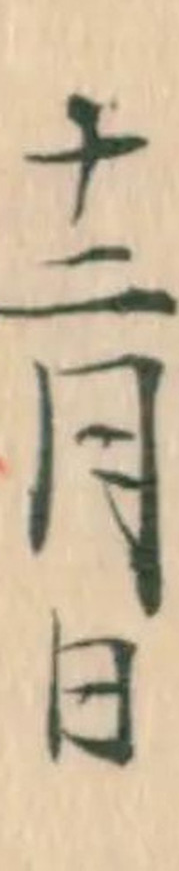十二月日
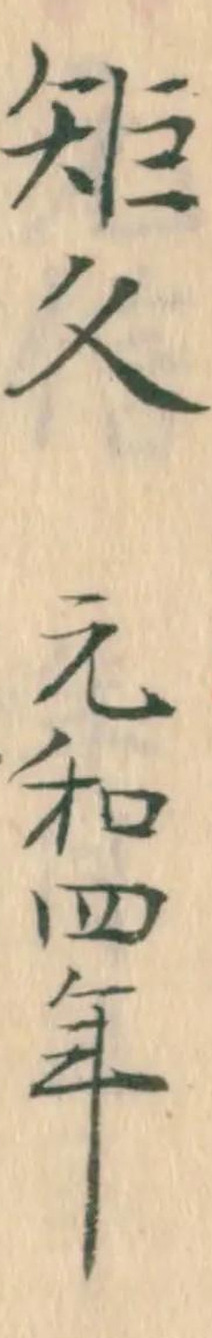矩久元和四年
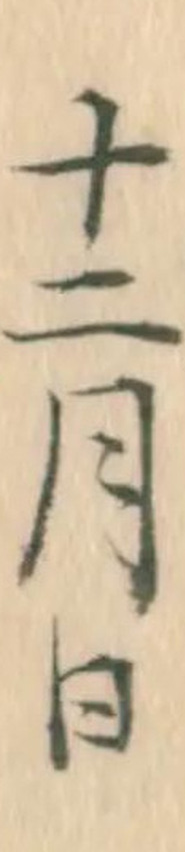十二月日
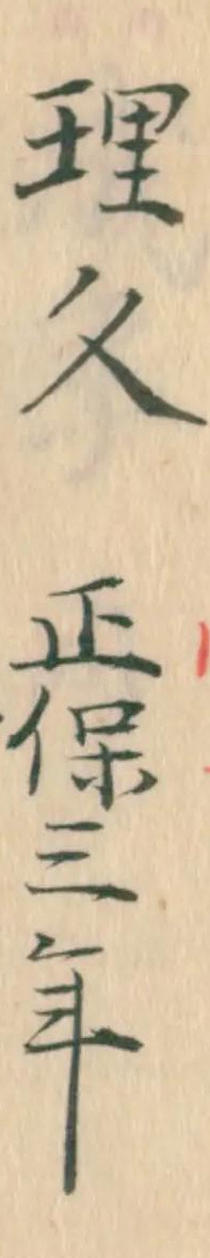理久正保三年
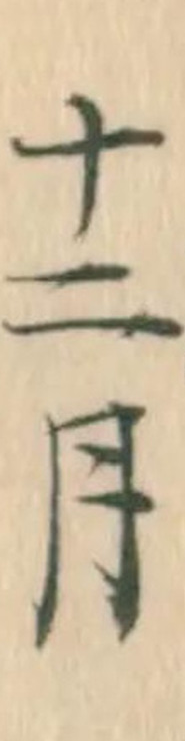十二月

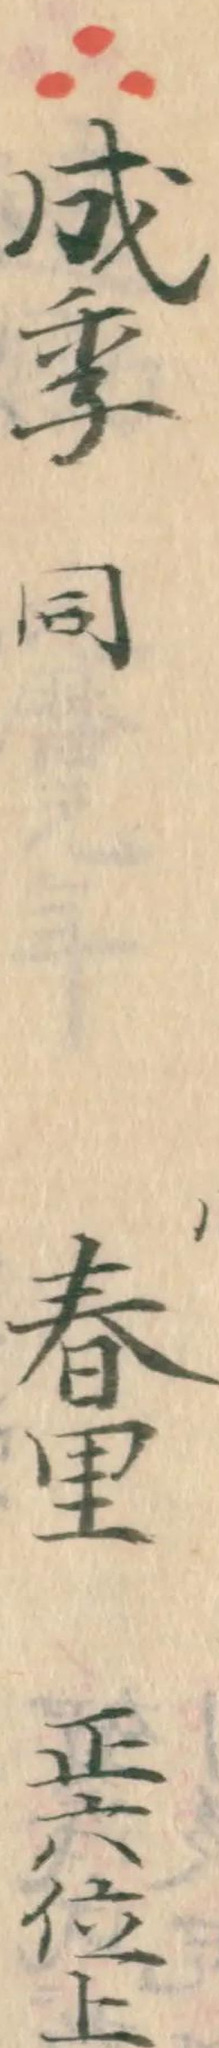∴成季同春里正六位上
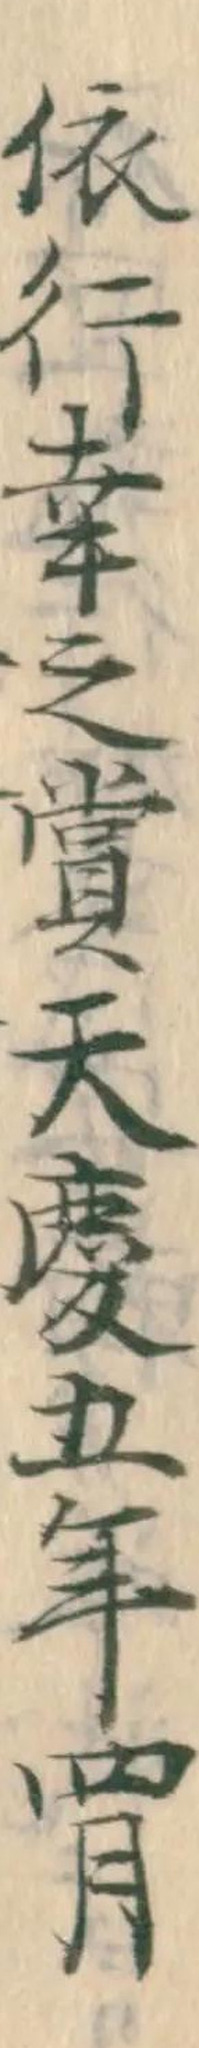依行幸之賞天慶五年四月
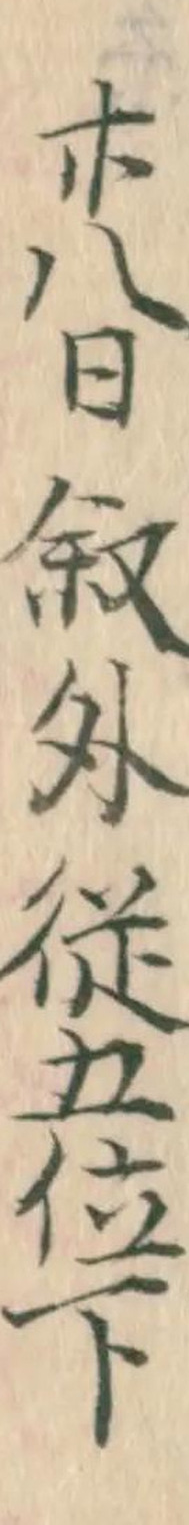廿八日叙外従五位下
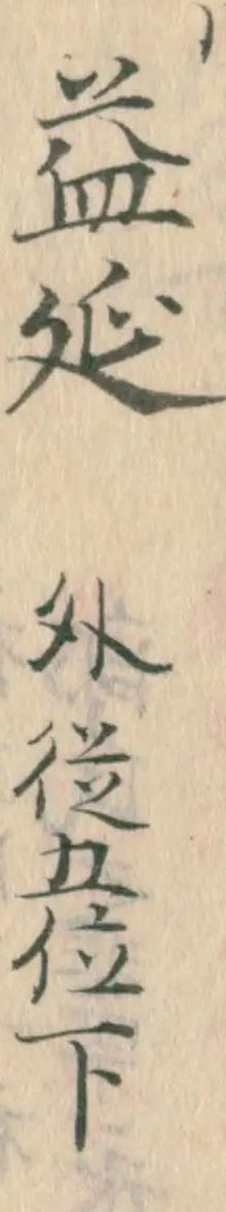益延外従五位下
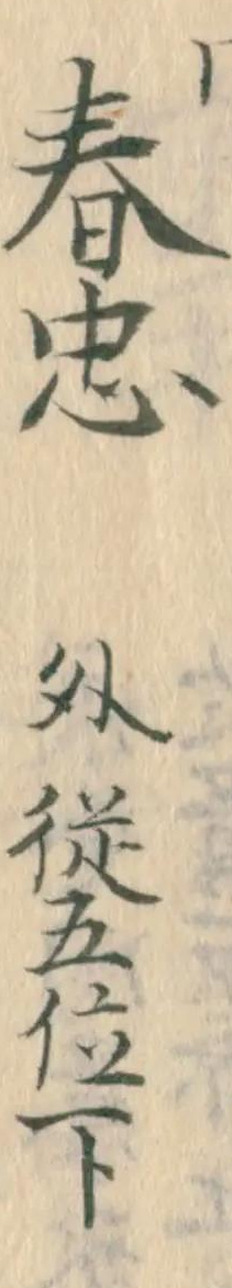春忠外従五位下

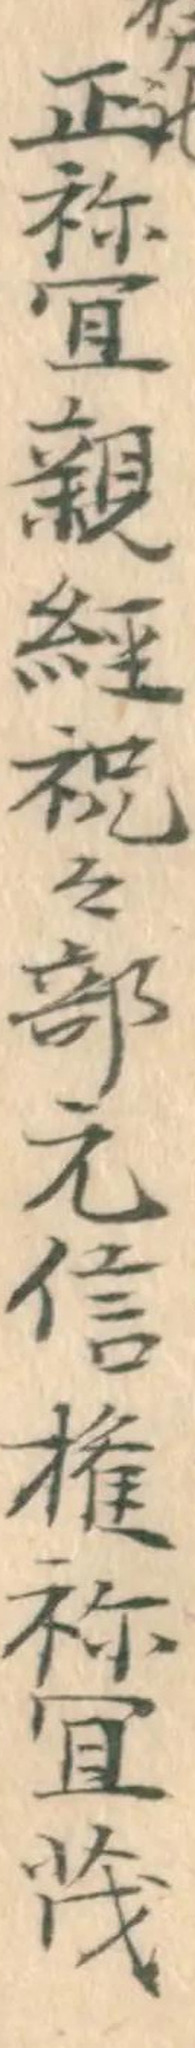正祢宜親経祝々部元信権称宜茂
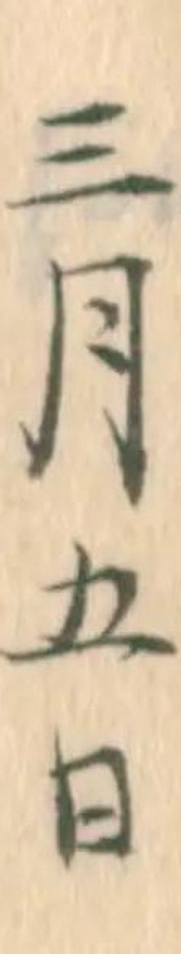七月五日
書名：賀茂社記録. 第23冊
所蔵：国立国会図書館 National Diet Library, JAPAN
